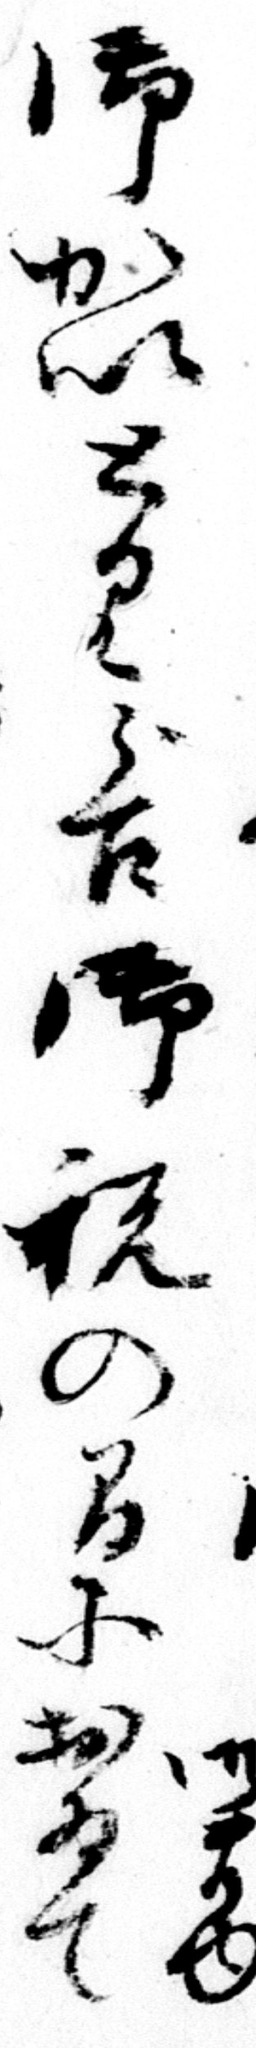御かいとり被召御祝の間におゐて
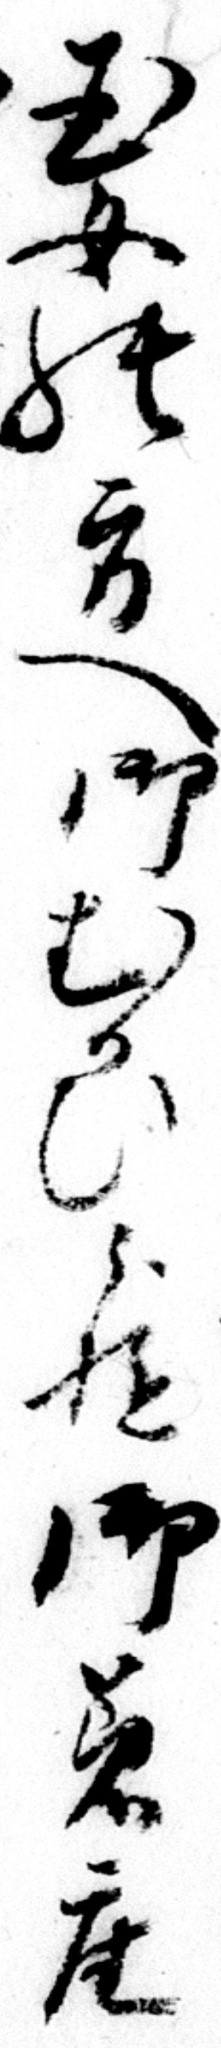玉女の方へ御むかひ被遊御着座
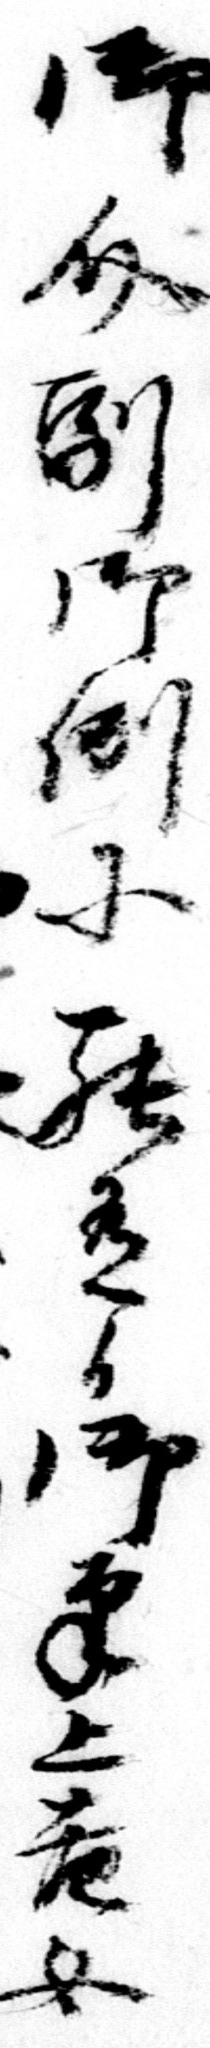御介副御側に罷有り御筆上老女
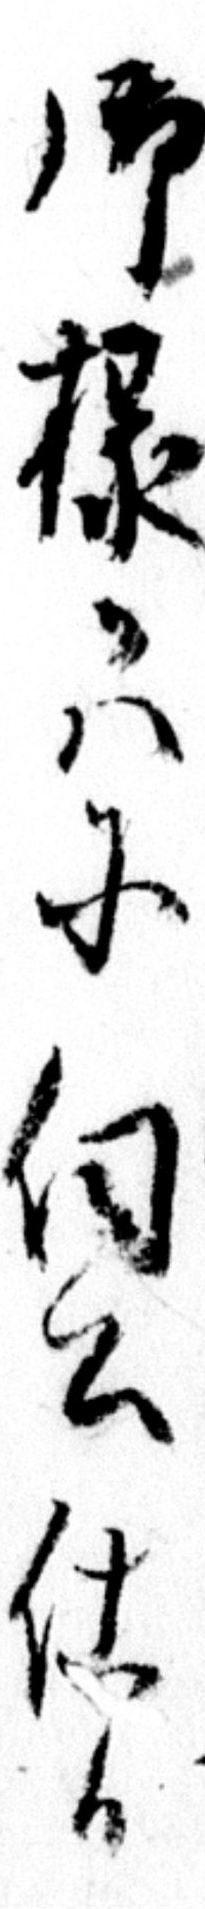御縁かハに伺公仕候
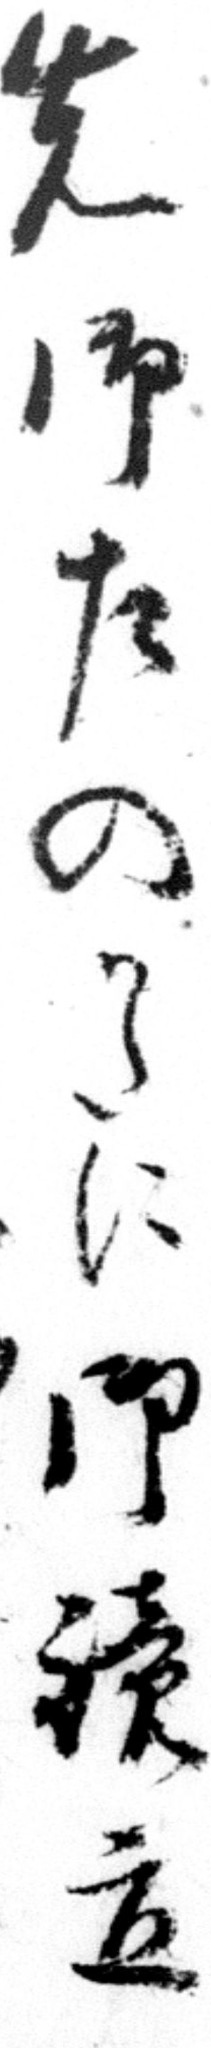先御左のかたに御鏡立
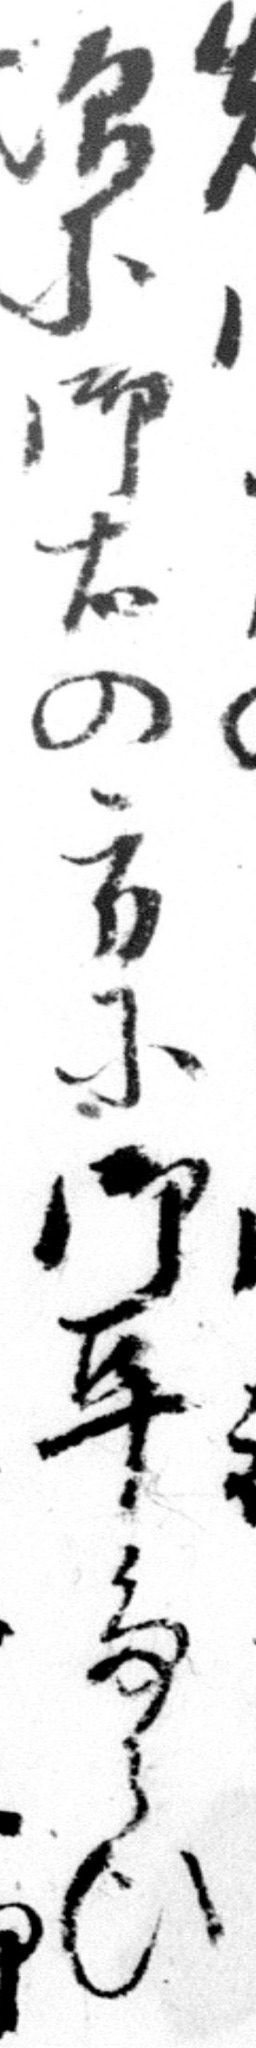次に御右の方に御他耳たらひ
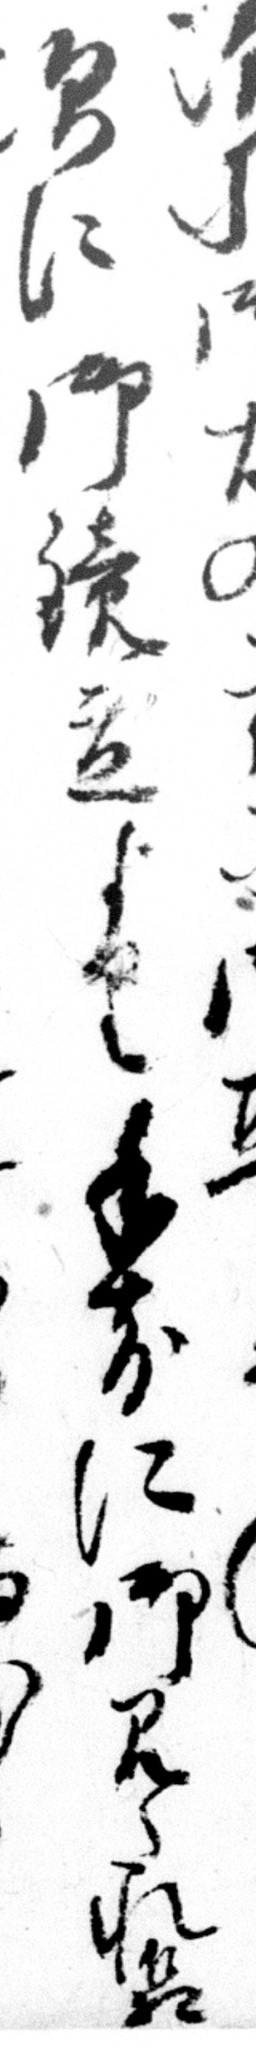次に御鏡立より手前に御みたれ箱
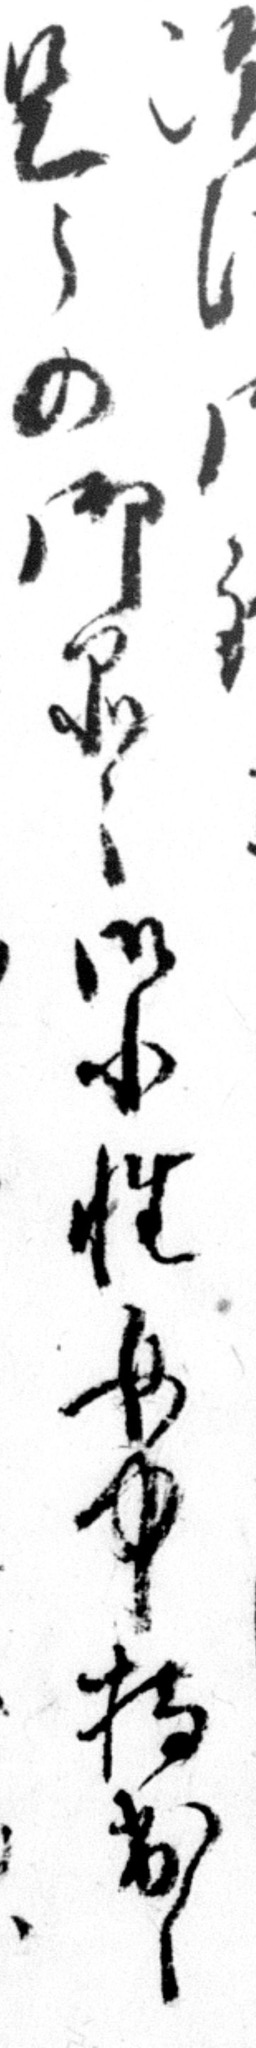是らの御品々御小性女中持出候
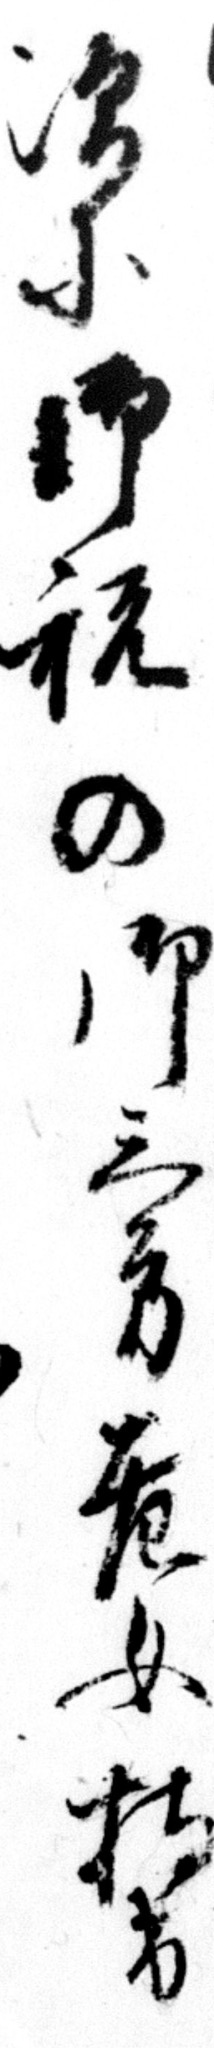次に御祝の御三方老女持出
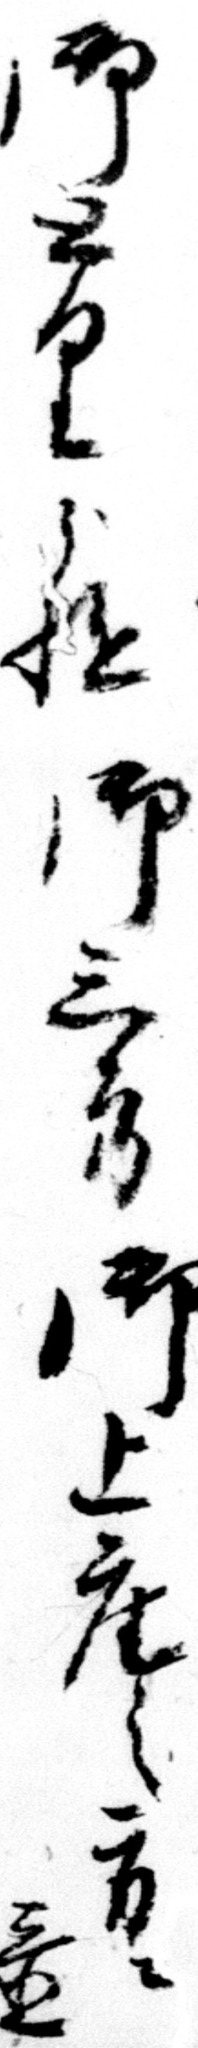御とり被遊御三方御上座之方ニ置
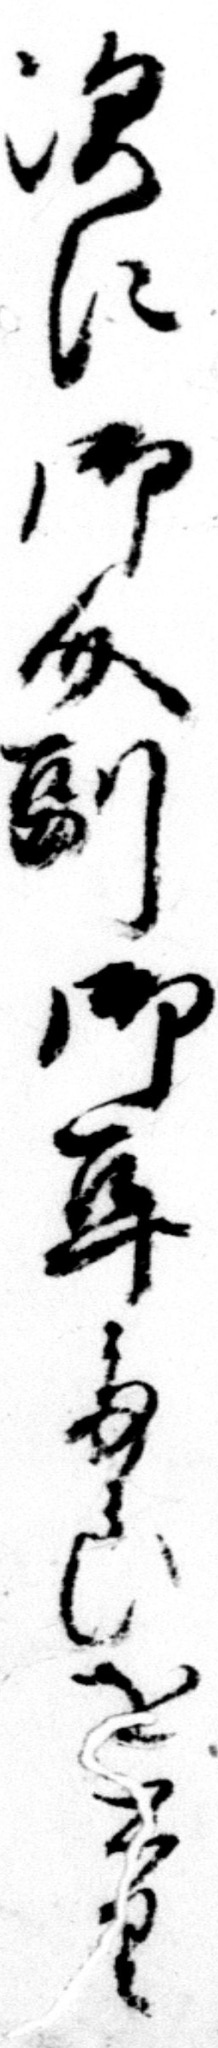次に御介副御耳たらひをとり
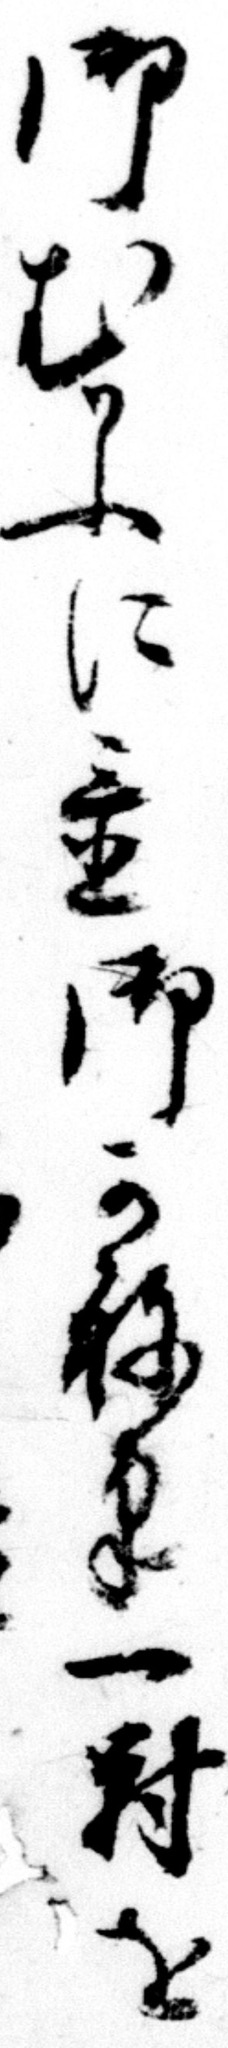御むかふに置御かね筆一對を
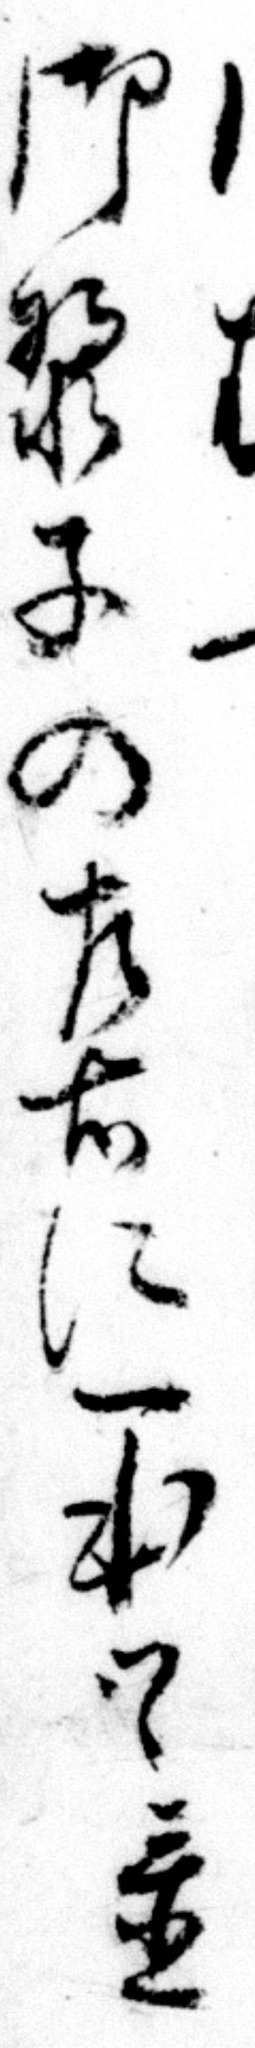御漿子の左右に一本ツヽ置

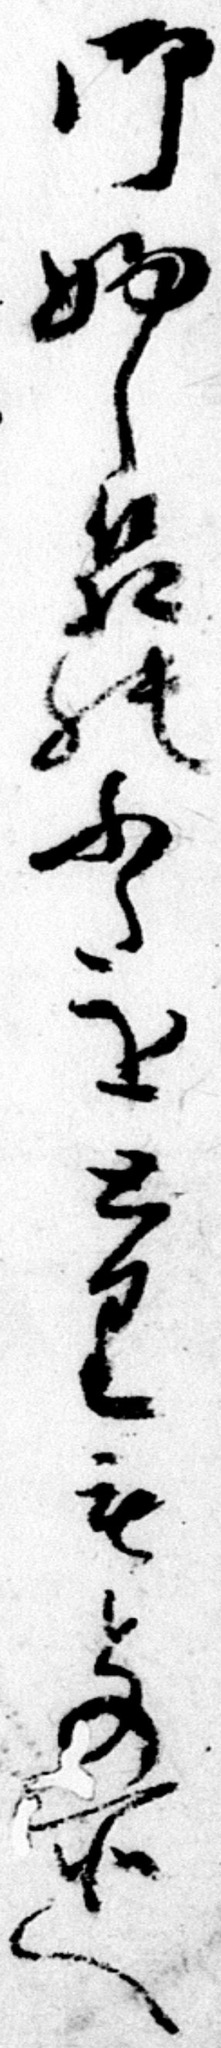御ふし箱のふたをとりもとの所へ
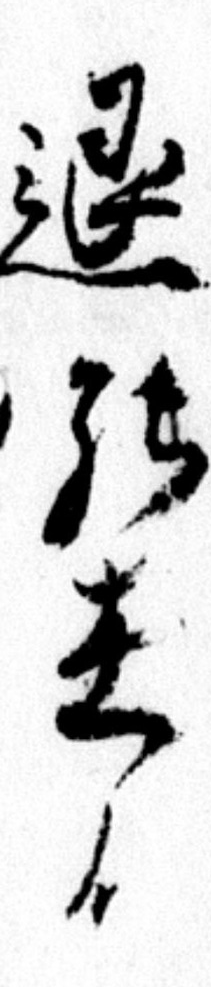退罷在候
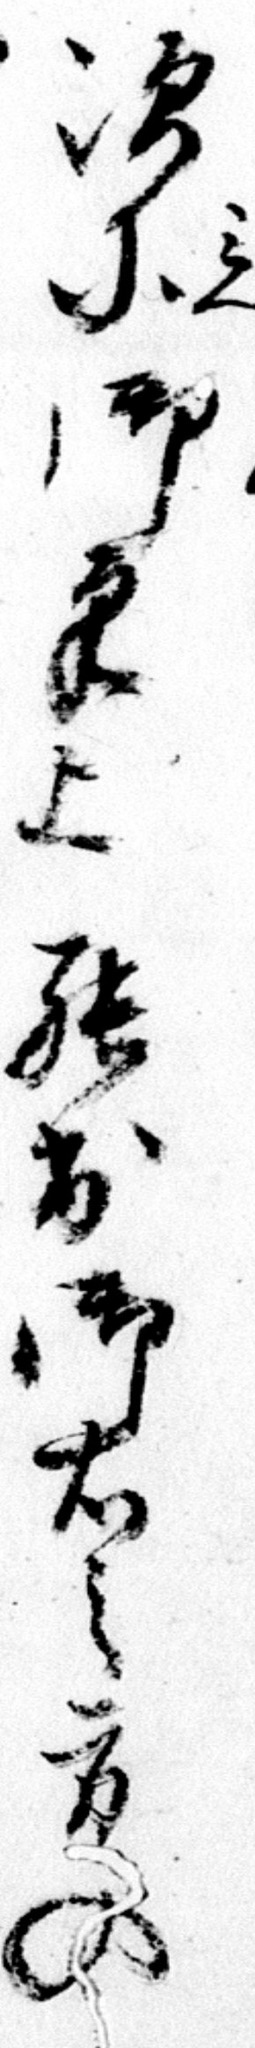次に御筆上罷出御右之方の
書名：光姫様御かねはじめ御式
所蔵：徳島県立図書館
